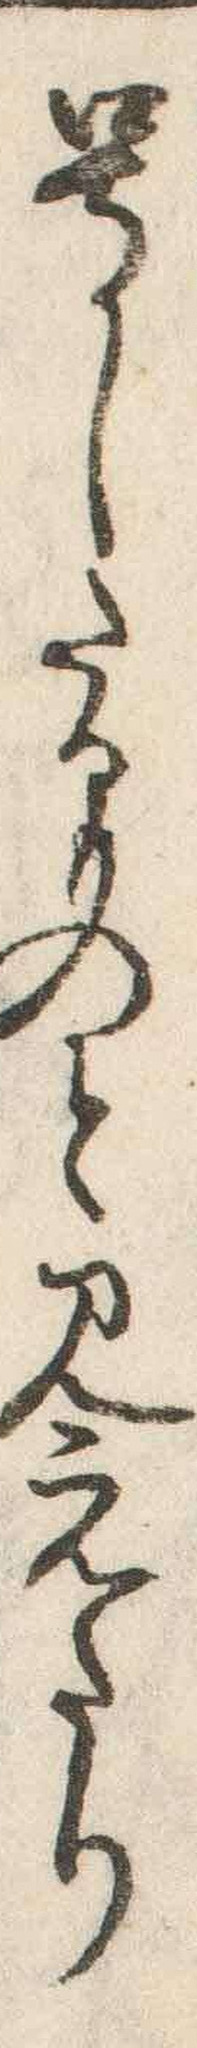号したるものと見えたり
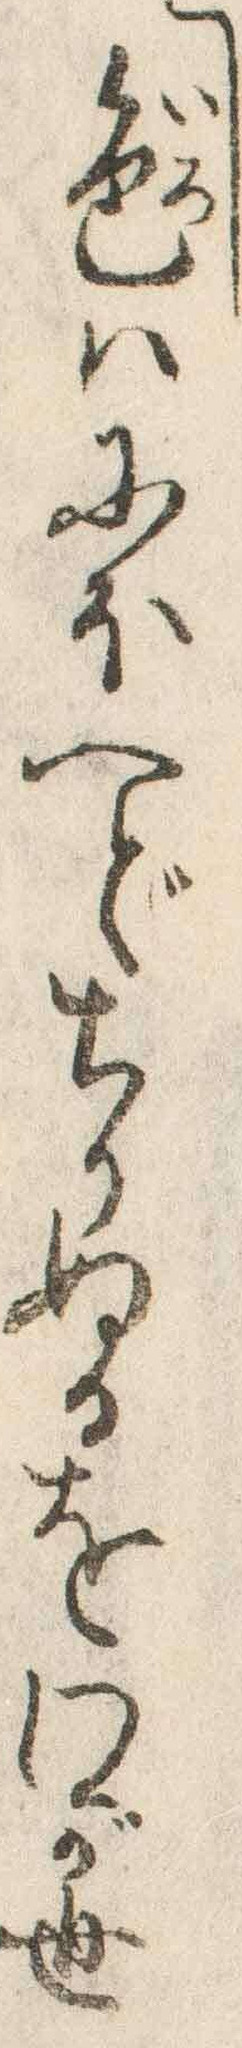〽色はにほへどちりぬるをわが世
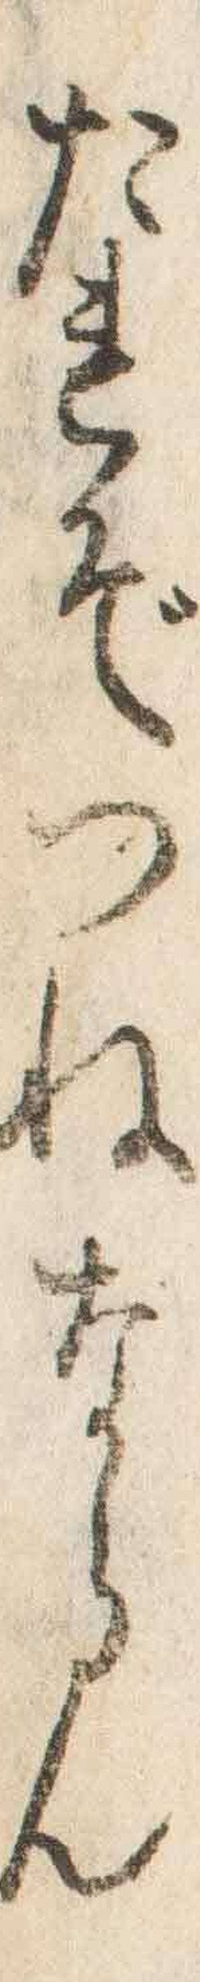たれぞつねならん
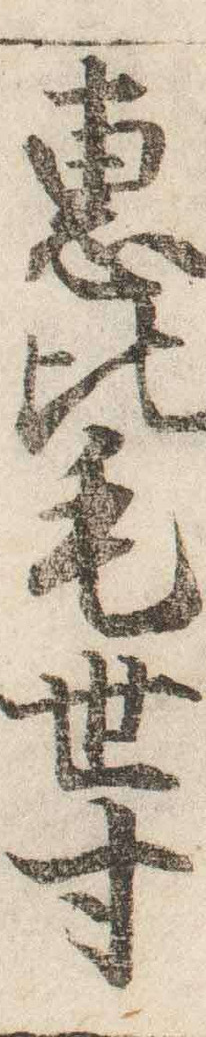恵比毛世寸
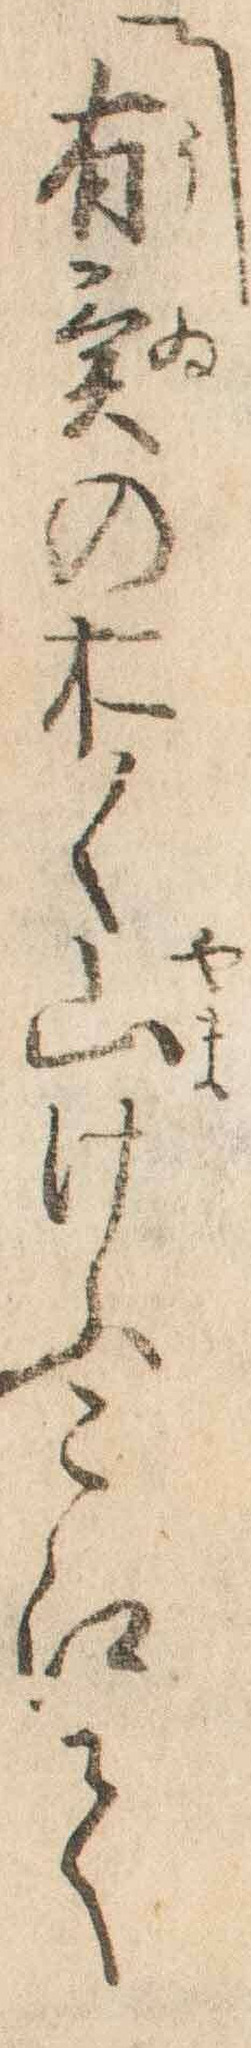〽有異のおく山けふこえて
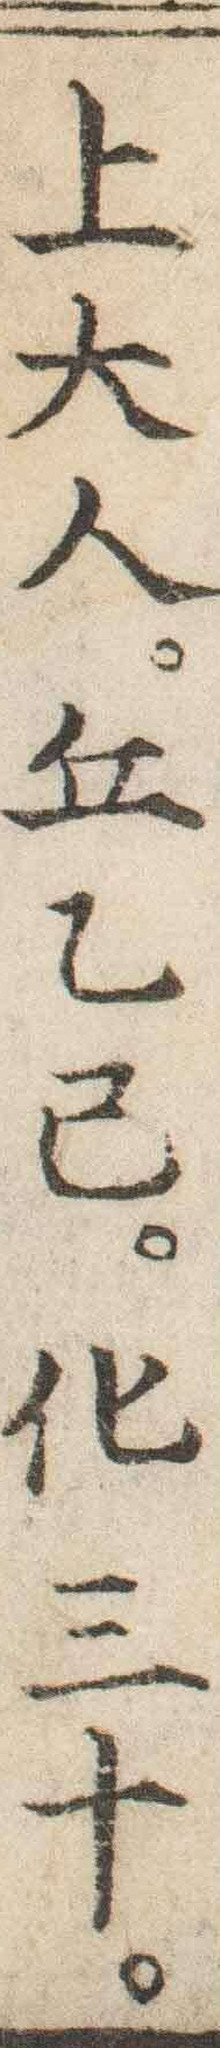唐上大人。丘乙己。化三十。
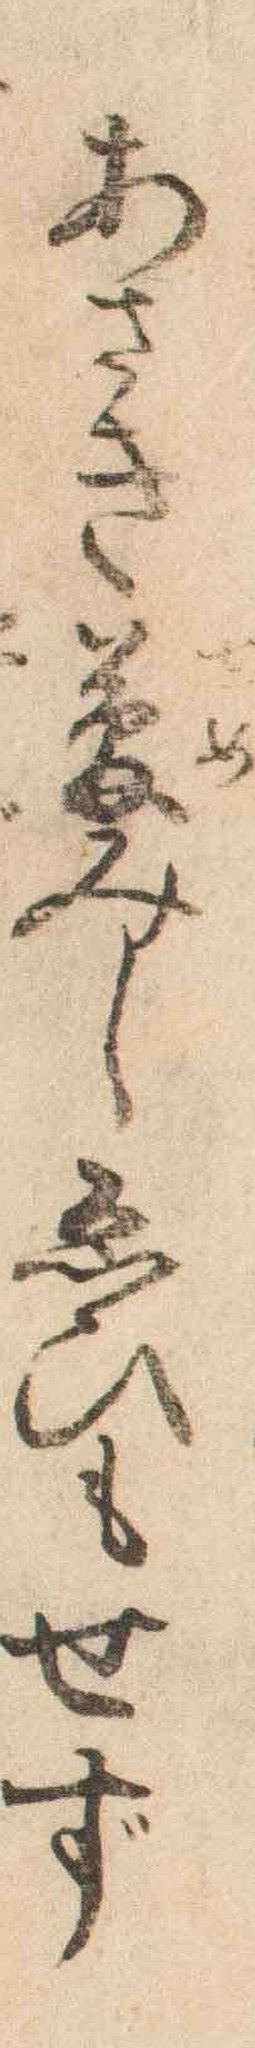あさき夢みしゑひもせず
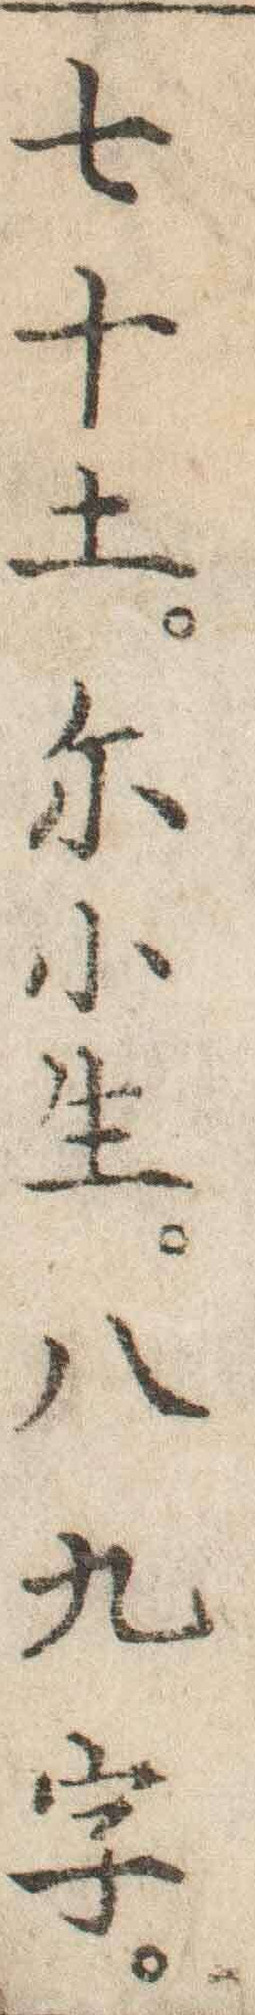土七十土。尓小生。八九字
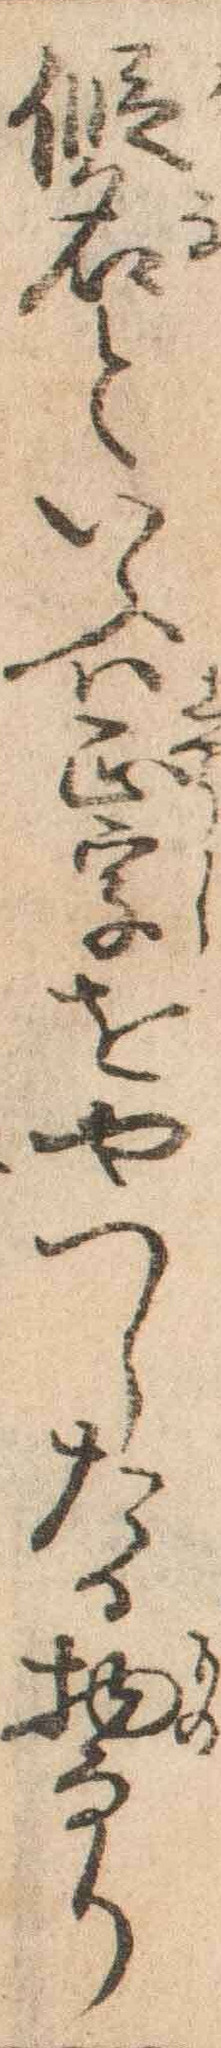假名といふは正字をやつしたる物なり
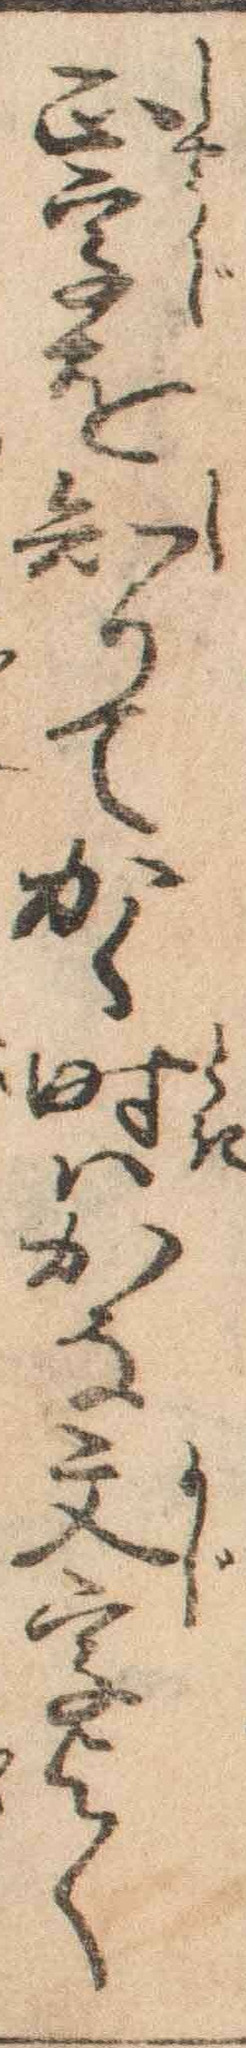正字を知りてかく時はかな文字よく
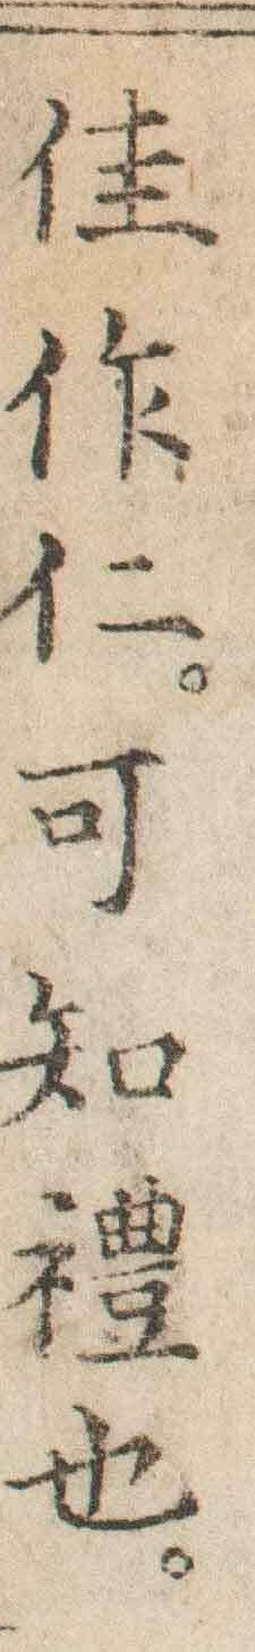以佳作仁。可知礼也。
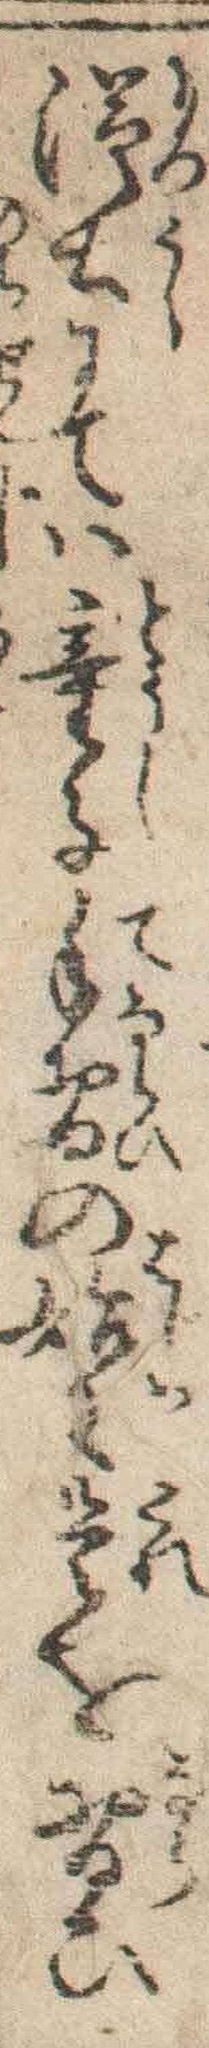呂漢土にては童子手習の始に是を習ひ
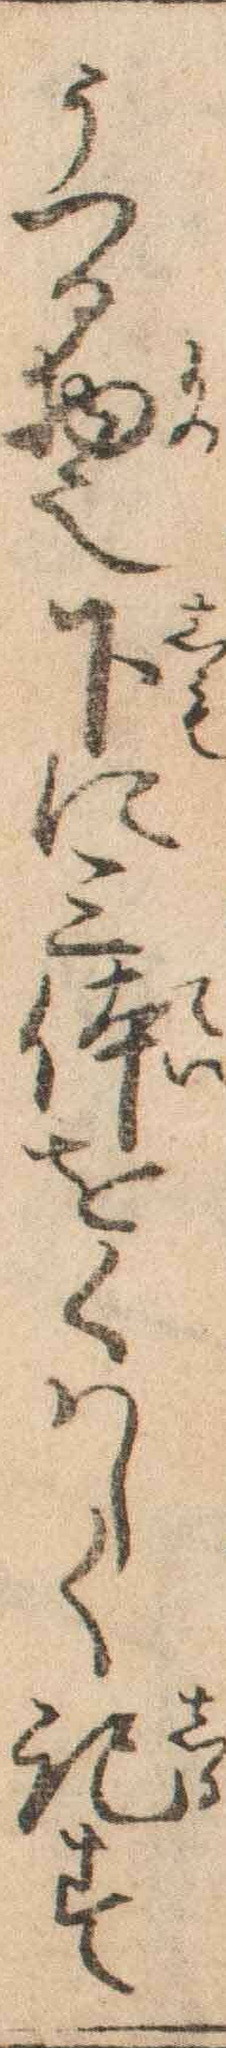うつる物也下に三体をくはしく記す
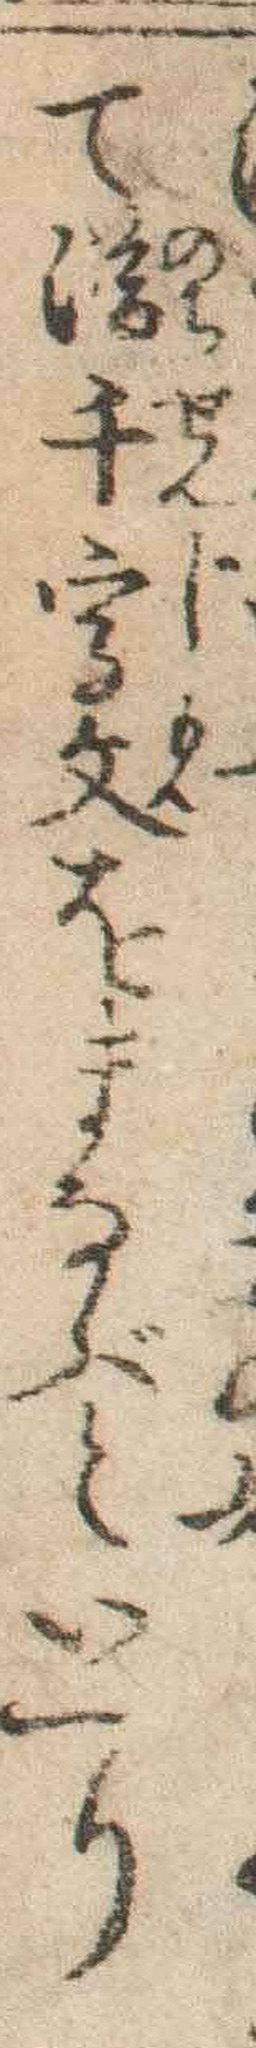波て後千字文をまなぶといへり

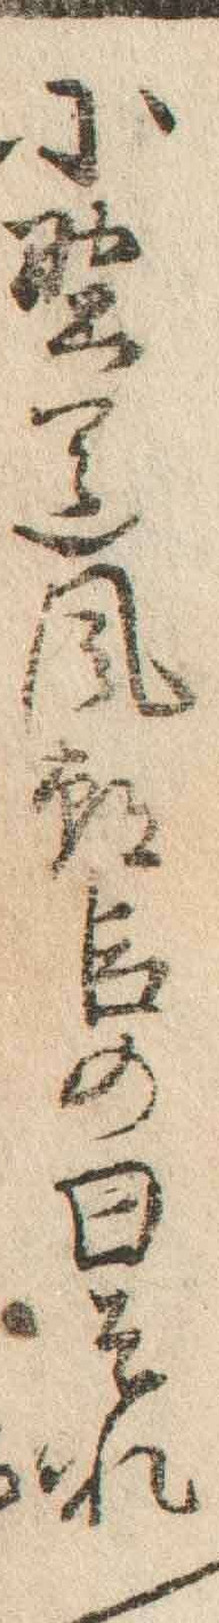小野道風朝臣の曰それ
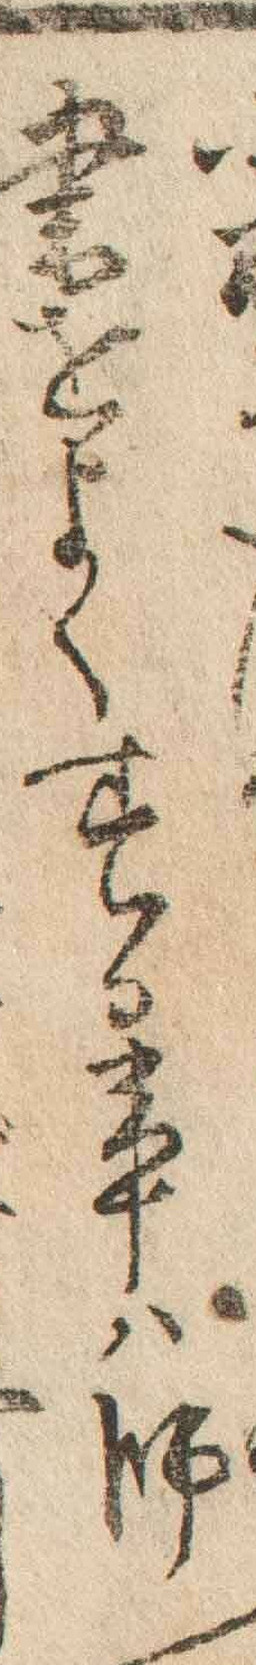書をよくする事は師
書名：撫育草
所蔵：東京学芸大学附属図書館 国文学研究資料館
